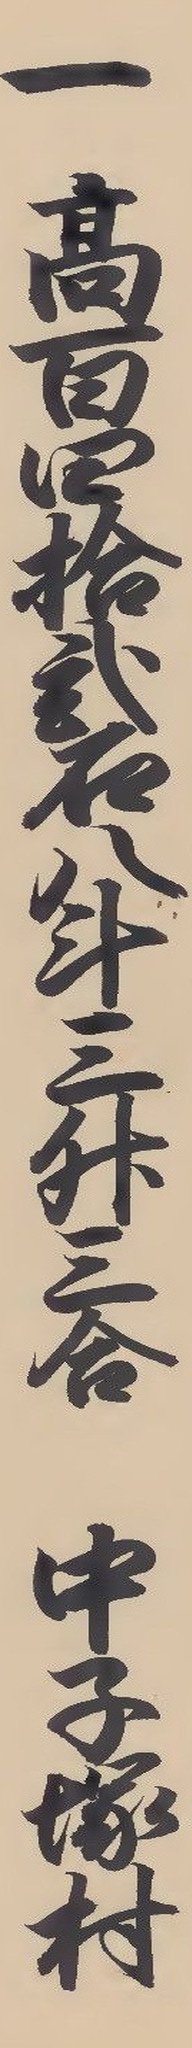一高百四拾弐石八斗三升三合中子塚村
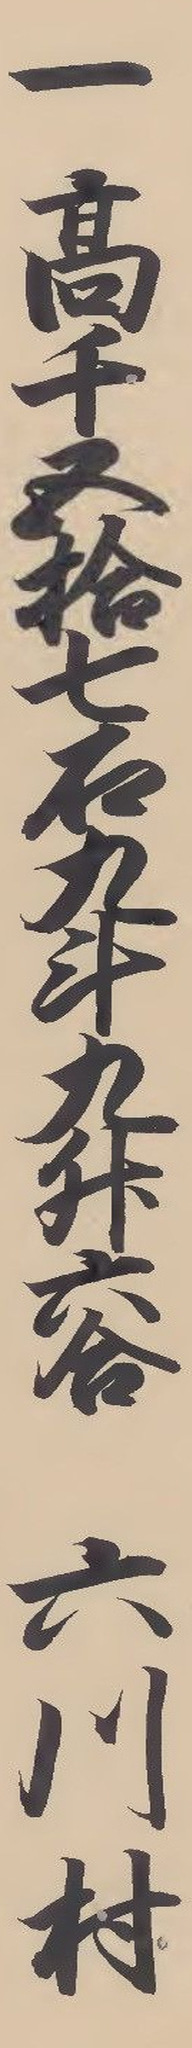一高千五拾七石九斗九升六合六川村
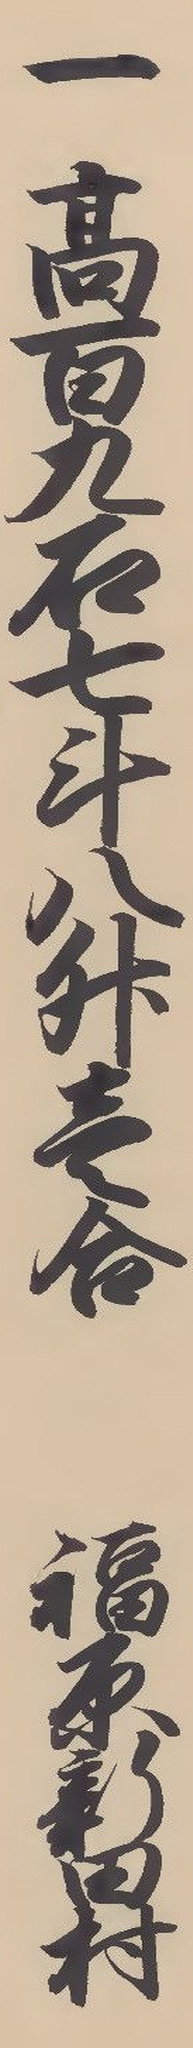一高百九石七斗八升壱合福原新田村
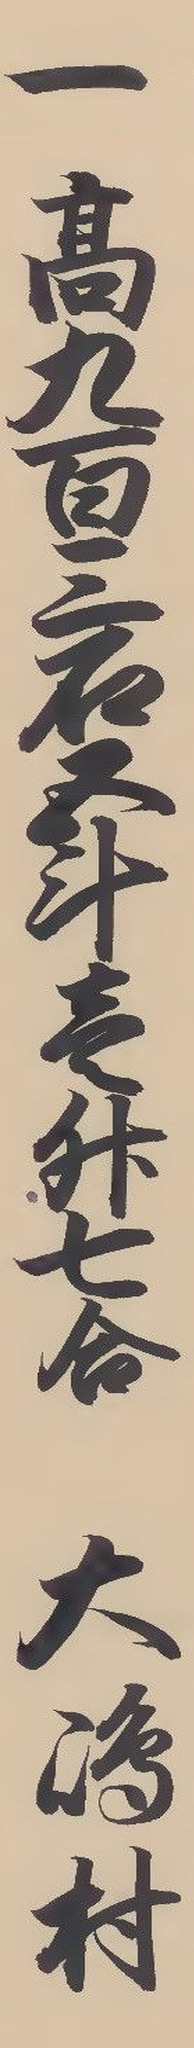一高九百三石五斗壱升七合大島村

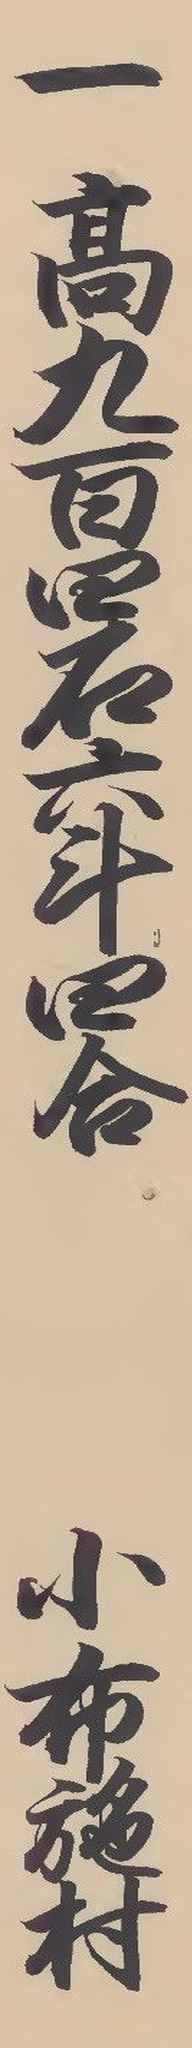一高九百四石六斗四合小布施村
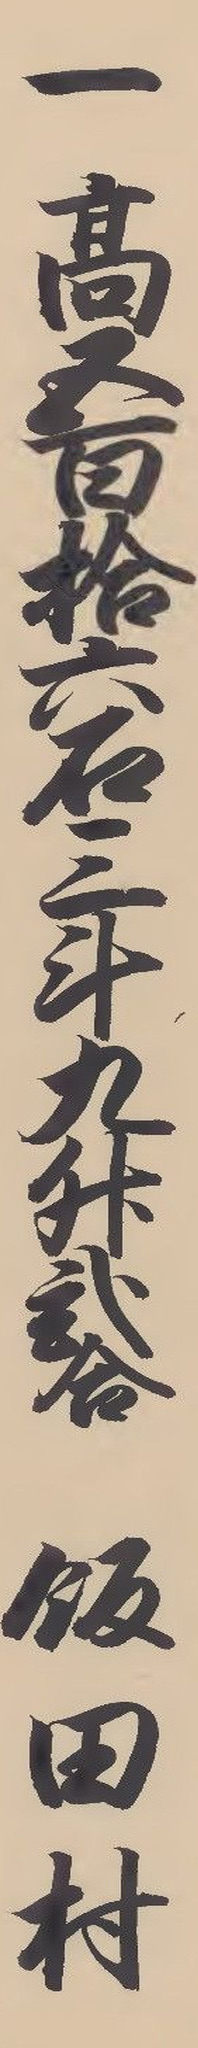一高五百拾六石三斗九升弐合飯田村
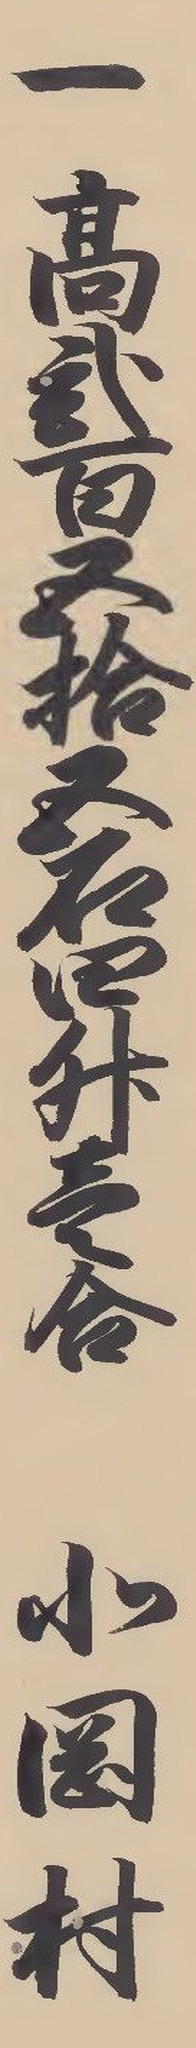一高弐百五拾五石四升壱合北岡村
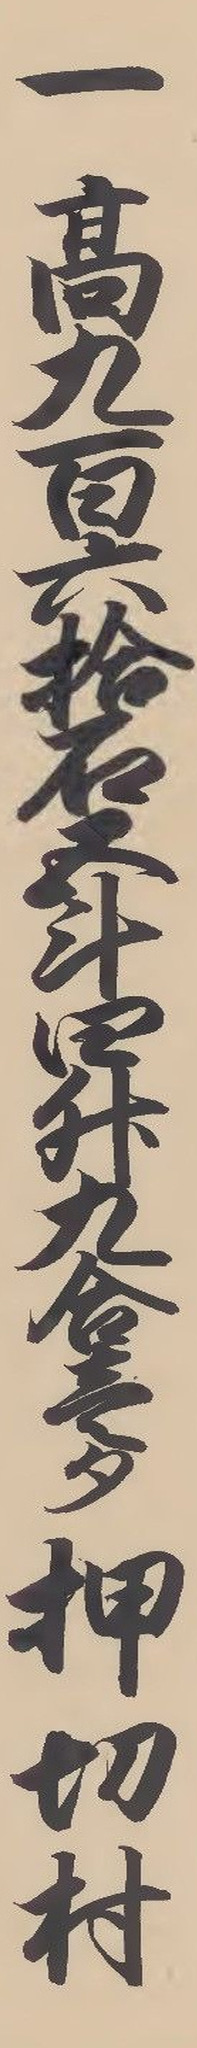一高九百六拾石五斗四升九合壱勺押切村
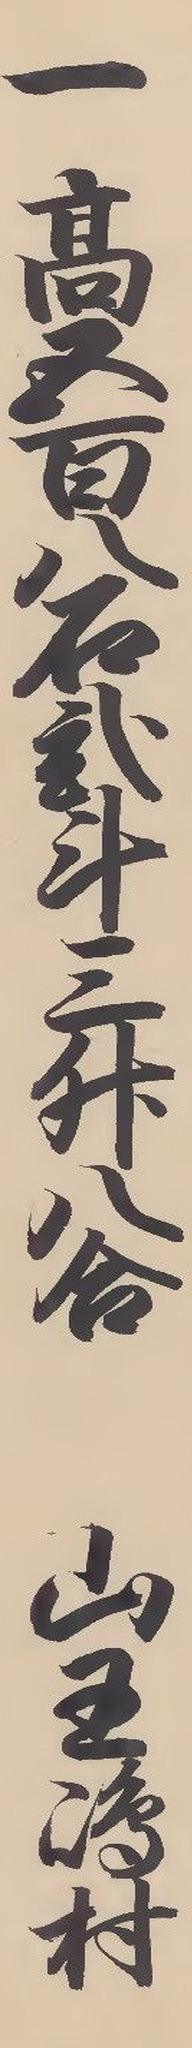一高五百八石弐斗三升八合山王島村
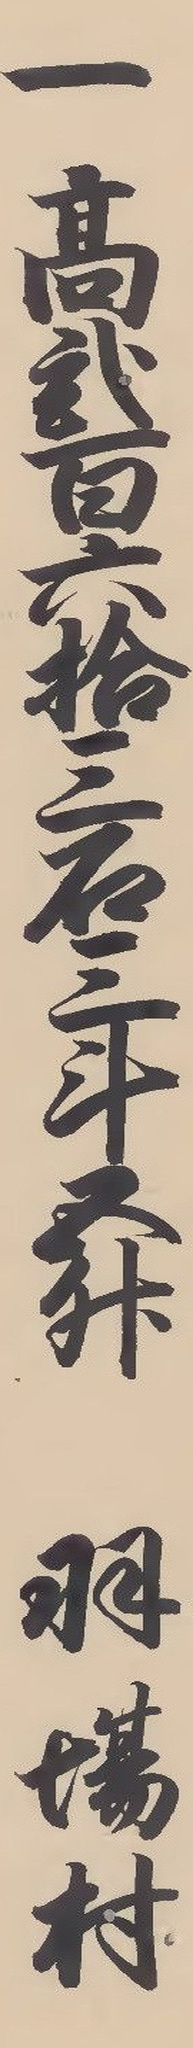一高弐百六拾三石三斗五升羽場村
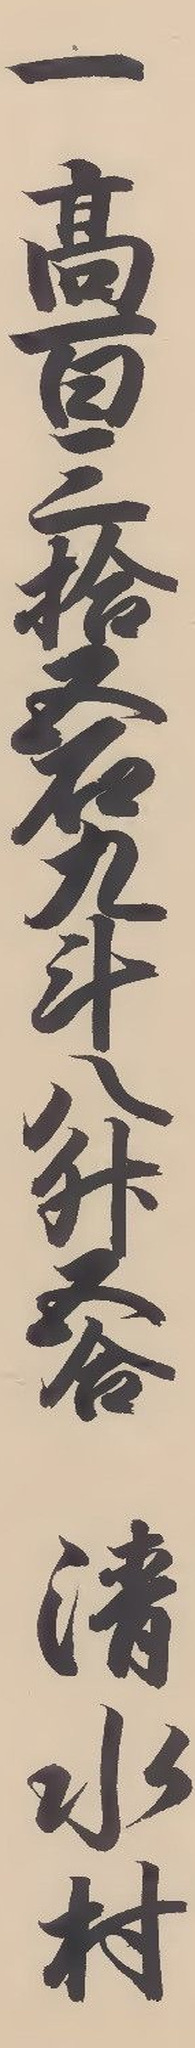一高百三拾五石九斗八升五合清水村
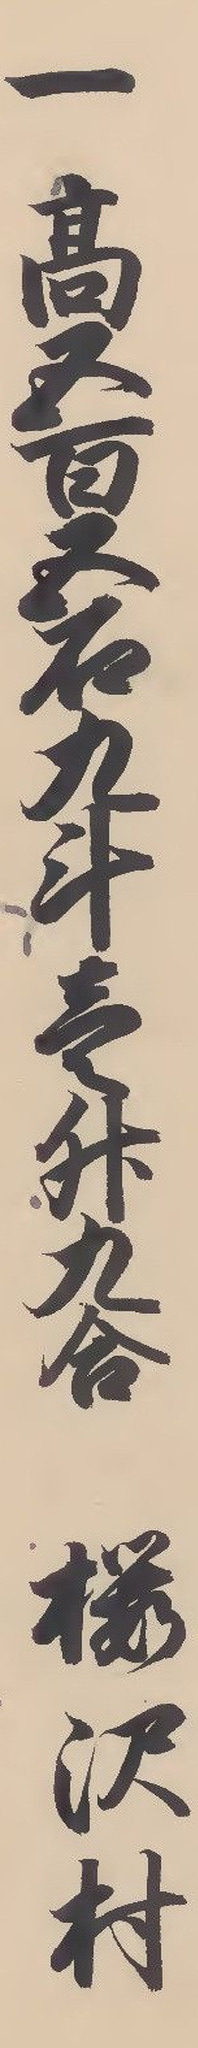一高五百五石九斗壱升九合桜沢村

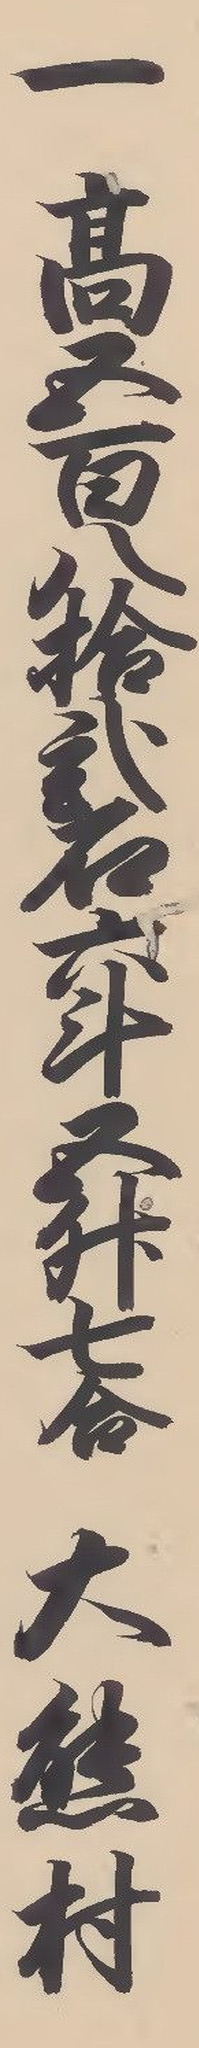一高五百八拾弐石六斗五升七合大熊村
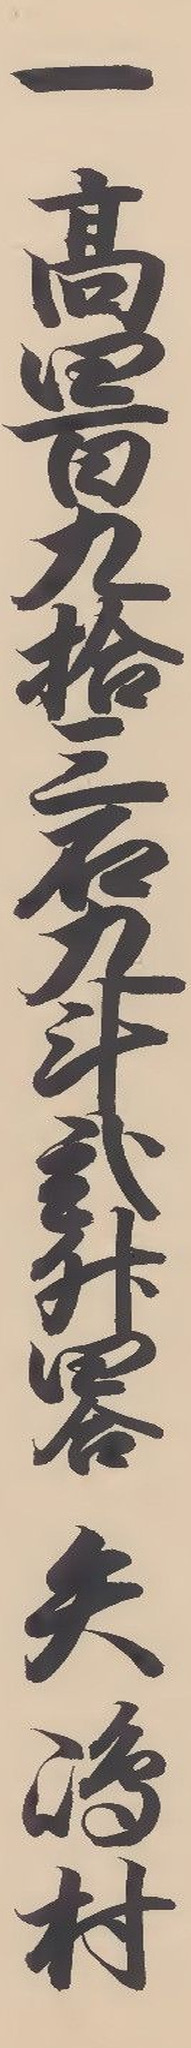一高四百九拾三石九斗弐升四合矢島村
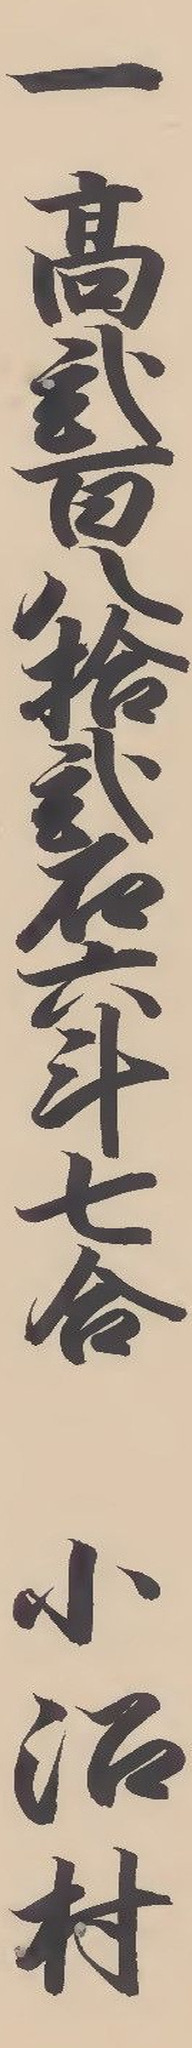一高弐百八拾弐石六斗七合小沼村
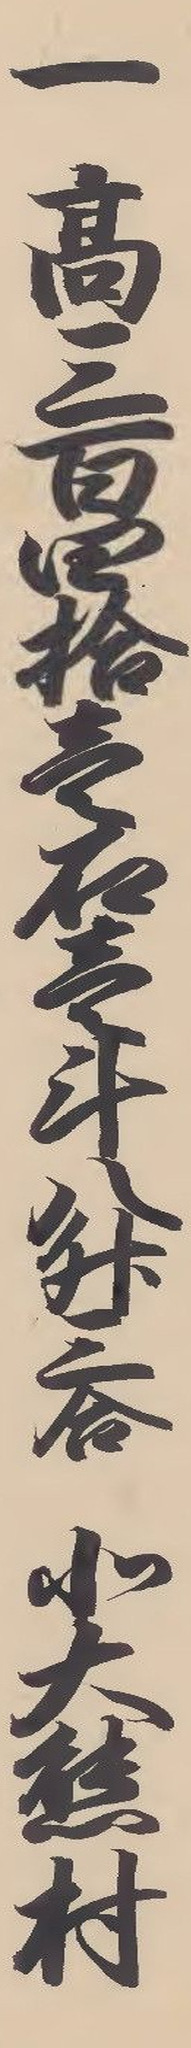一高三百四拾壱石壱斗八升三合北大熊村
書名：信濃国郷帳
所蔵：国立公文書館 National Archives of Japan
